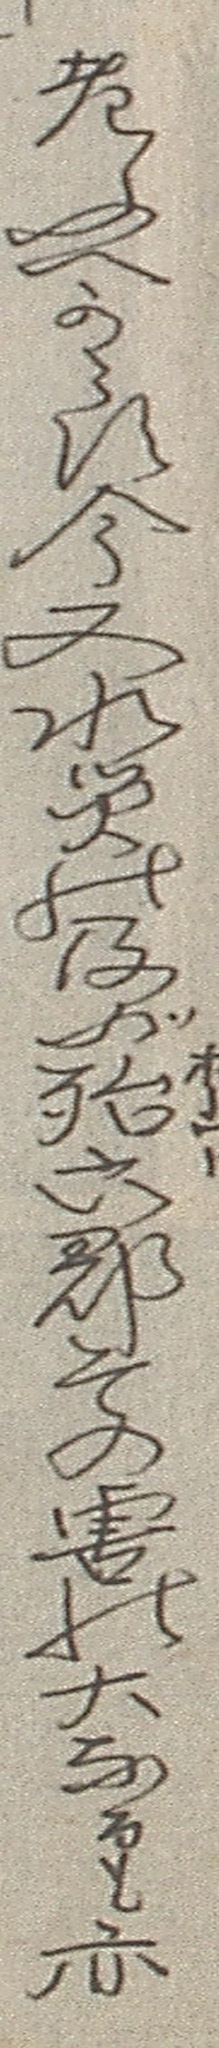老ふへからす今又水災の及ふ殆六郡その害の大なるも亦
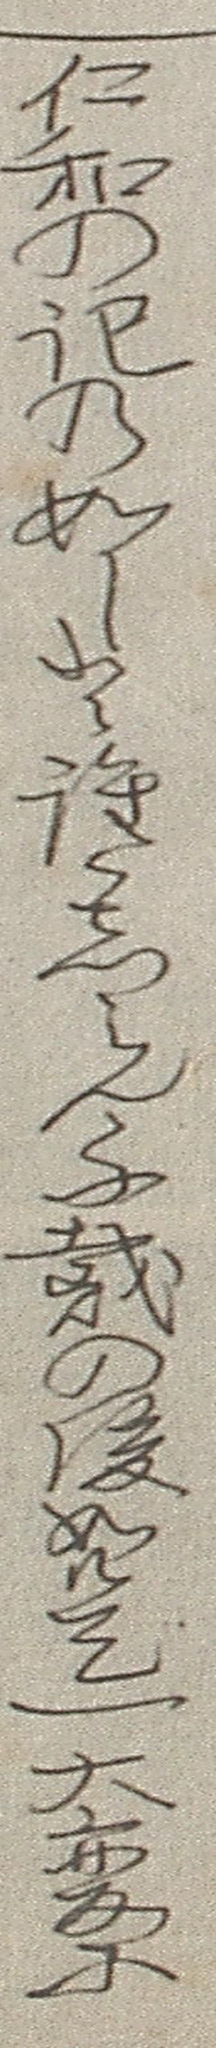仁和の記の如しと誰かしらん千載の後如是一大変に
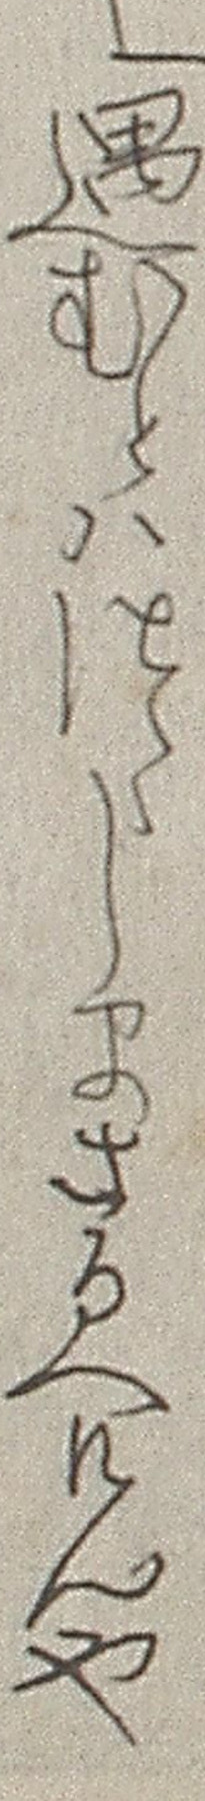遇むとはつゝしまさるへけんや
